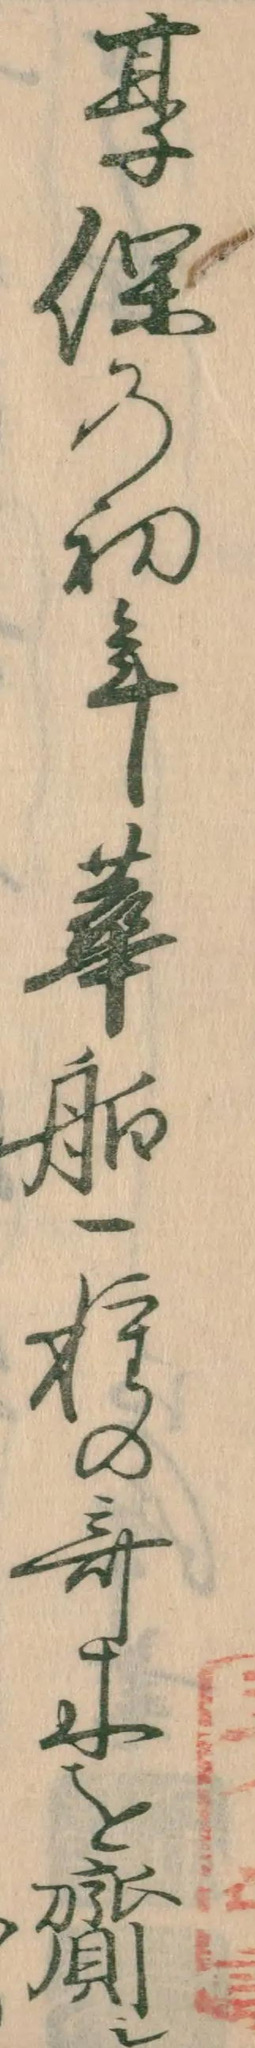享保の初年華船一種の奇木を齎し
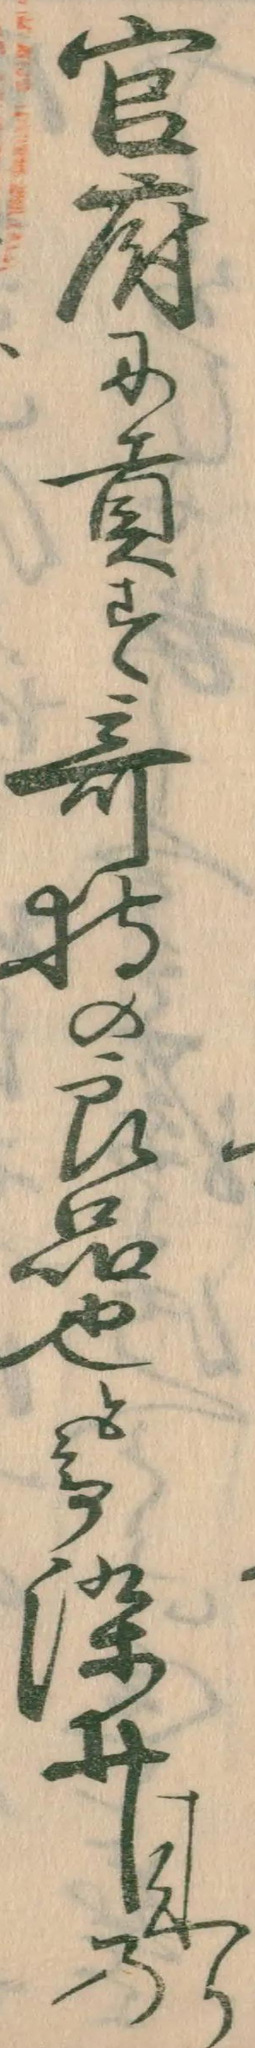官府に貢す奇特の良品也と而染井来りの
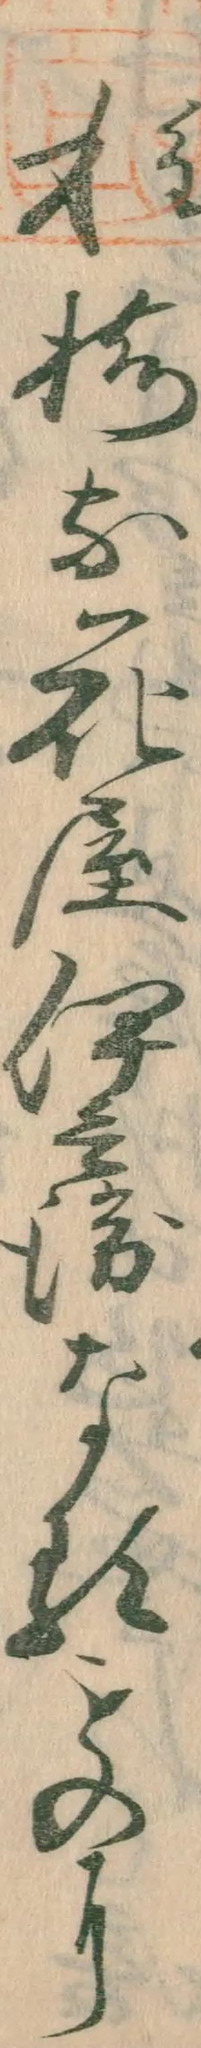種樹家花屋伊兵衛なるものに
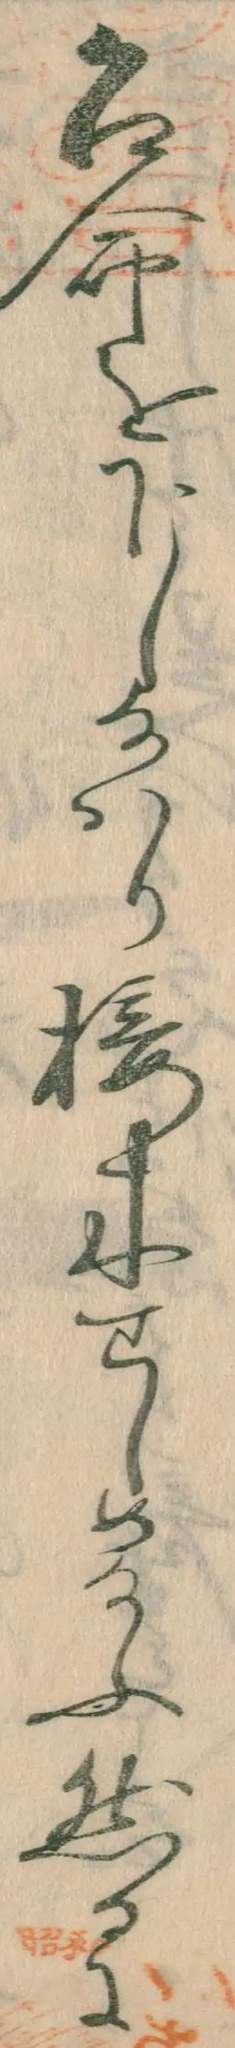召命を下し給はり接木せしめ給ふ然るに
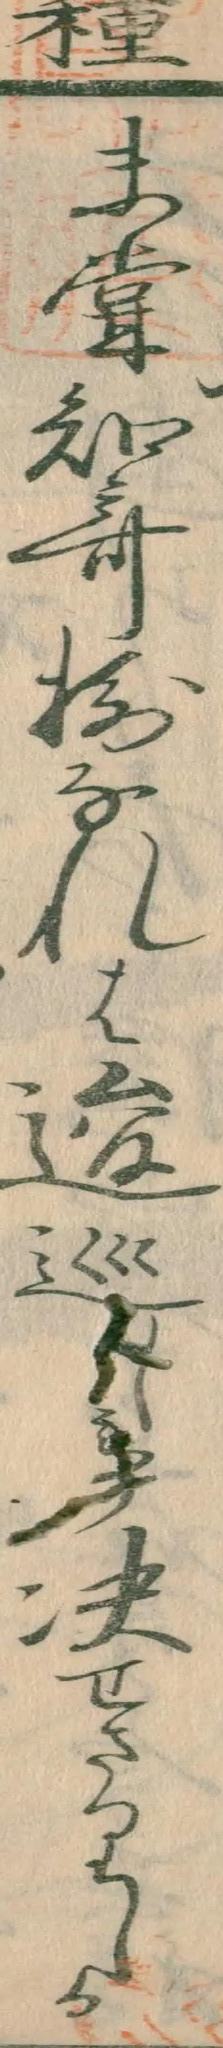未嘗知奇樹なれは逡巡して決せさりしか
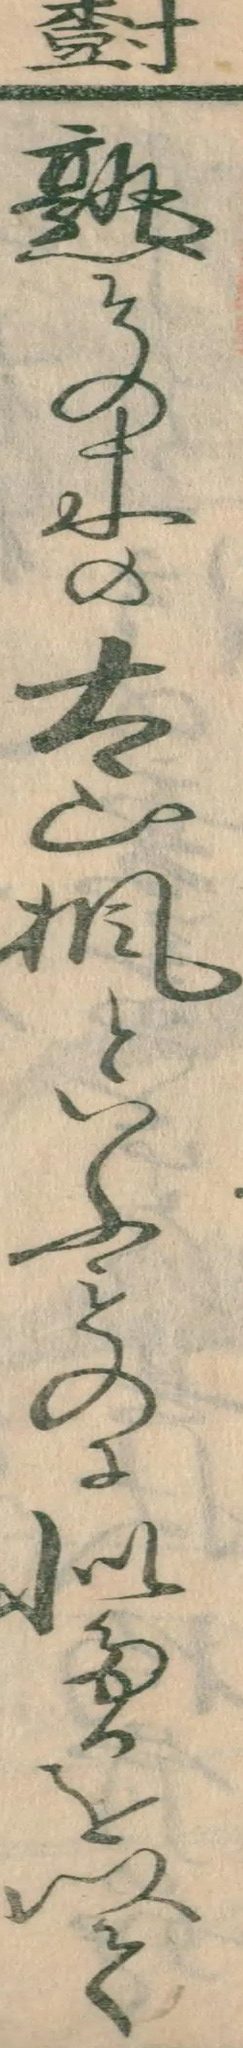熟その木の太山楓といふものに似たるを以て
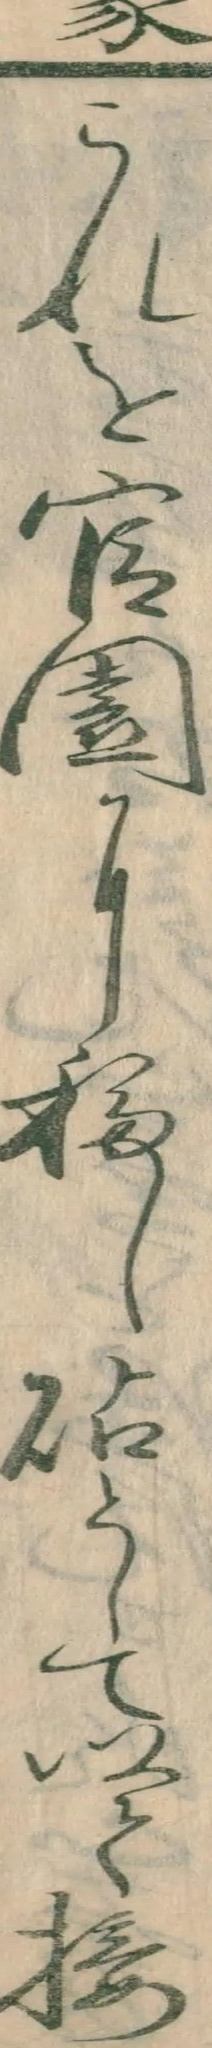これを官園に移し砧として以て接
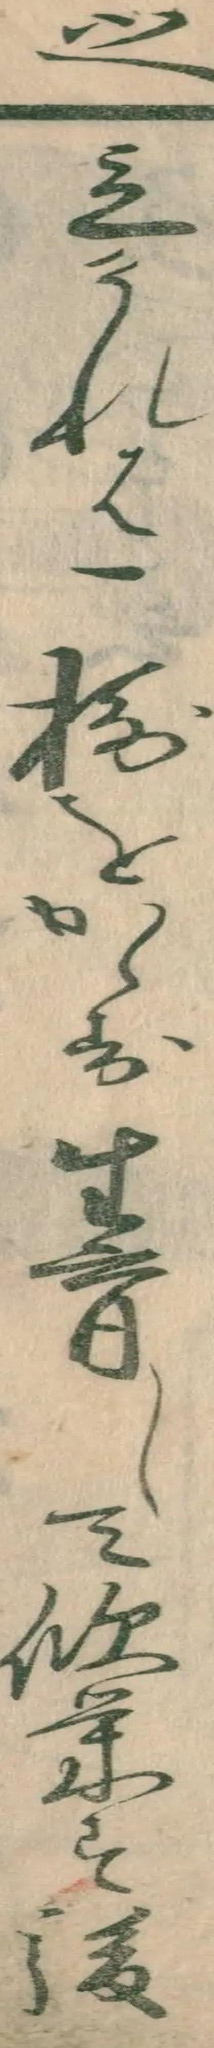立けれは一樹をかゝす生育して欣栄す後
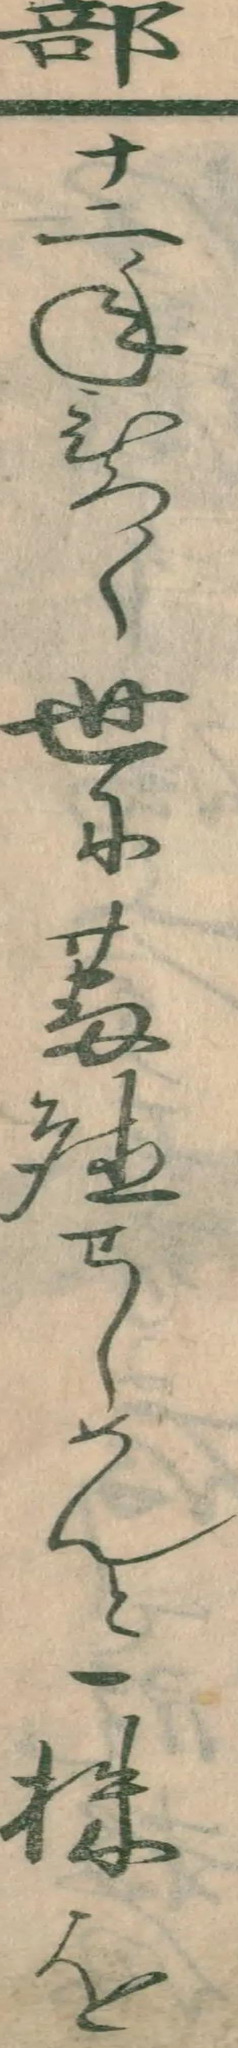十二年ひろく世に蕃殖せしめんと一株を

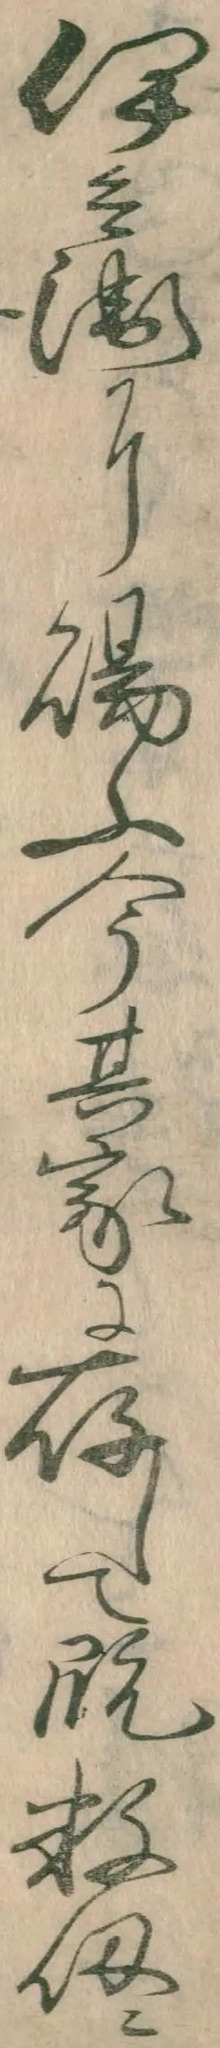伊兵衛に賜ふ今其家に存して既数仭に
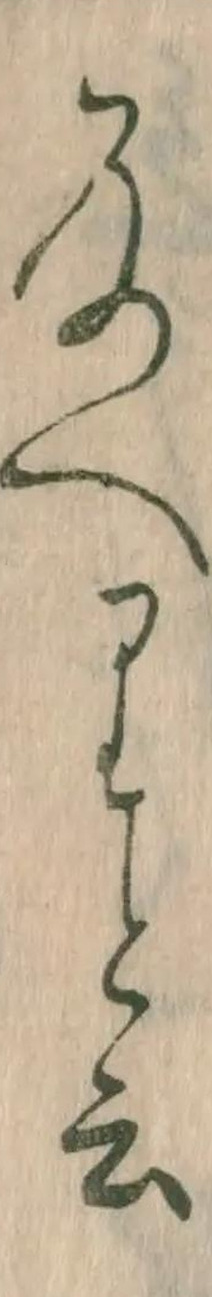及へりと云
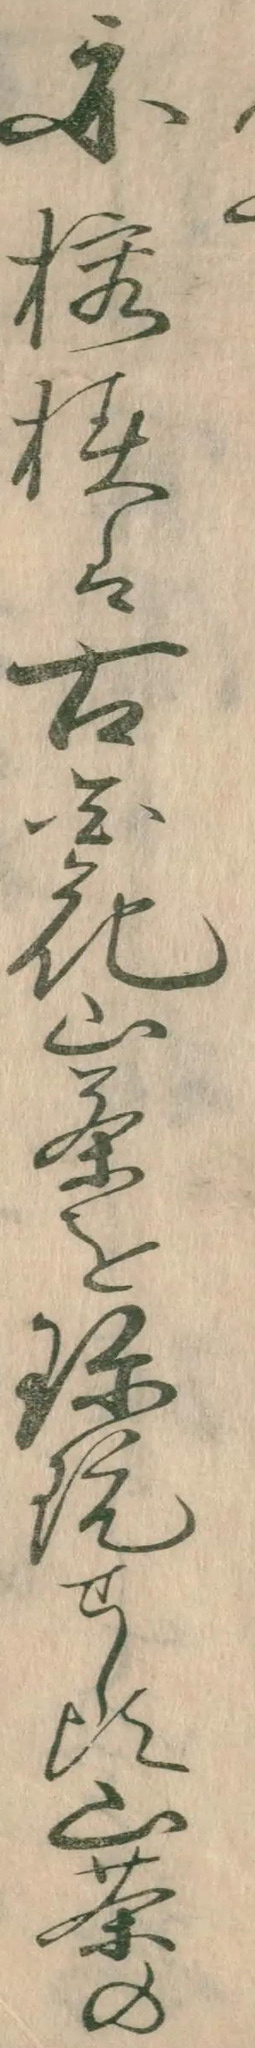亦榕椿は古白花山茶を珍玩せし頃山茶の
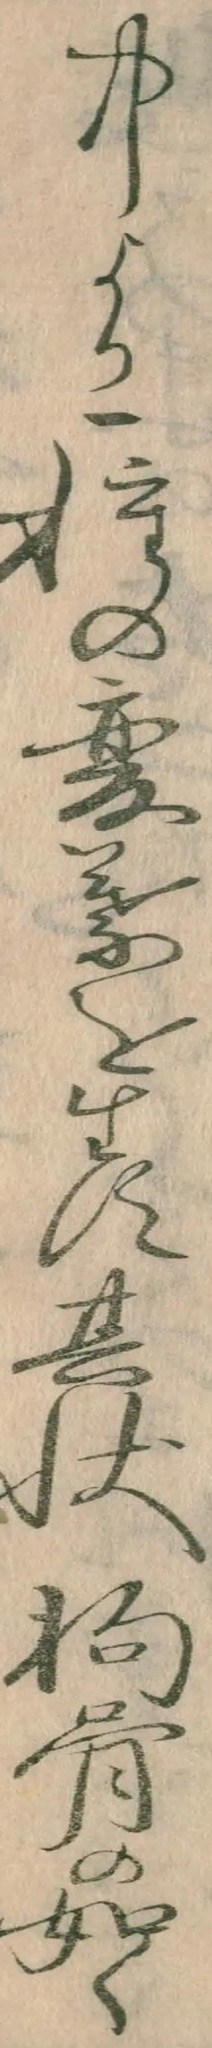中より一種の変葉を生す其状枸骨の如く
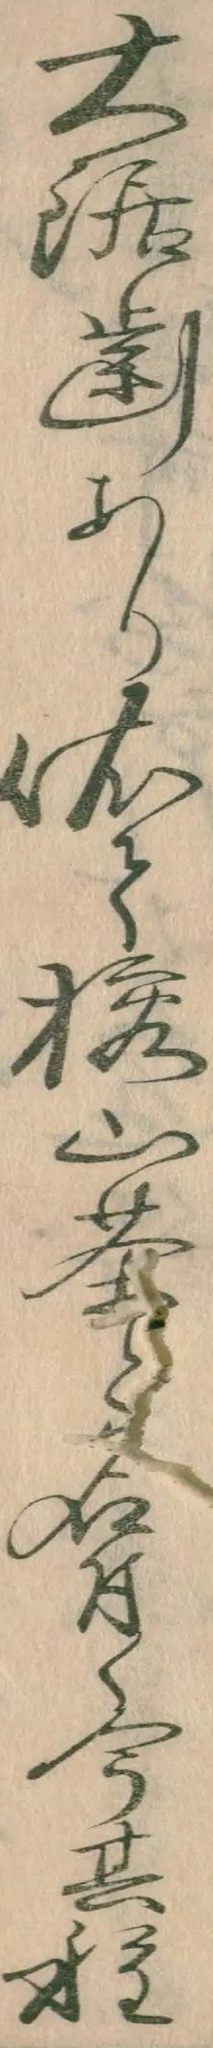大鋸歯あり依て榕山茶と名付く今其種
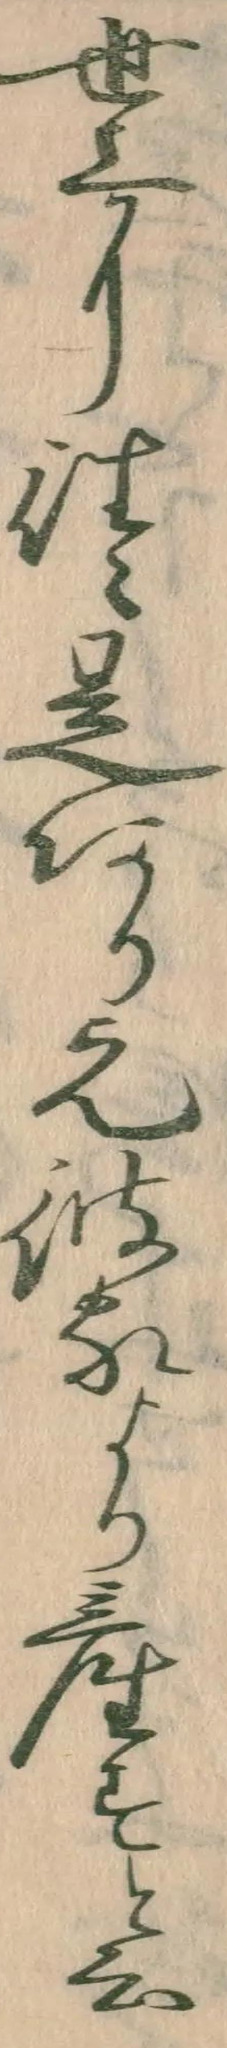世上に往々是あり元彼家より産すと云
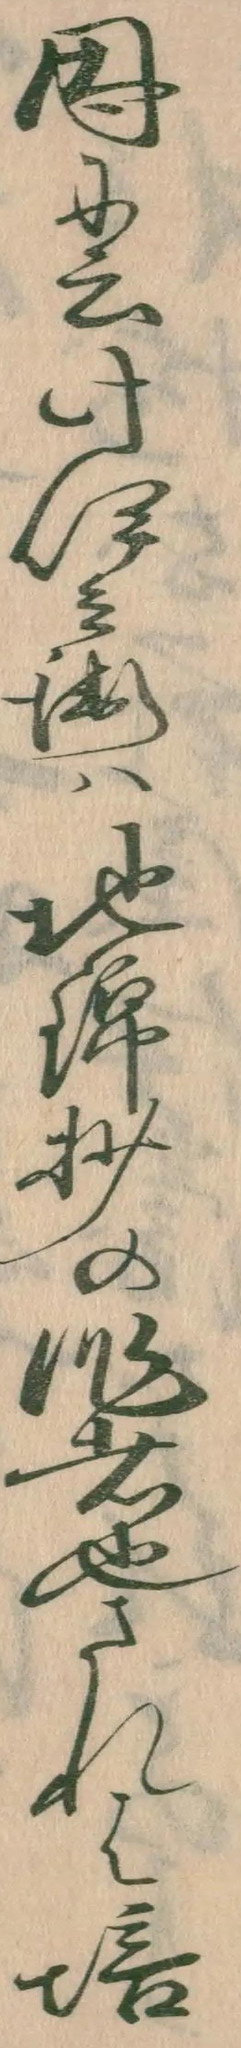因に云此伊兵衛は地錦抄の作者也されは培
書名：草木奇品家雅見 3巻. [3]
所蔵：国立国会図書館 National Diet Library, JAPAN
